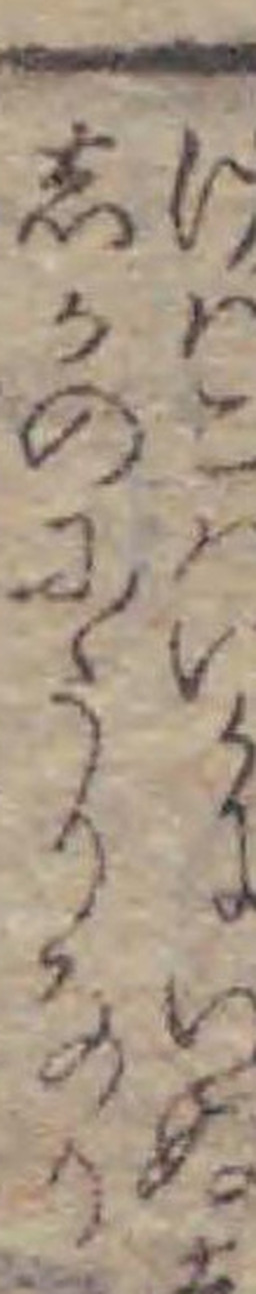しかのにうりなり
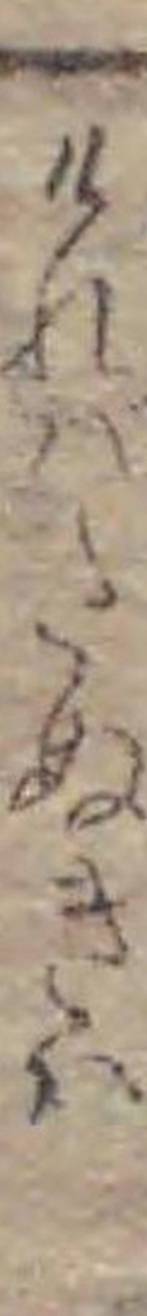ければたぬきは
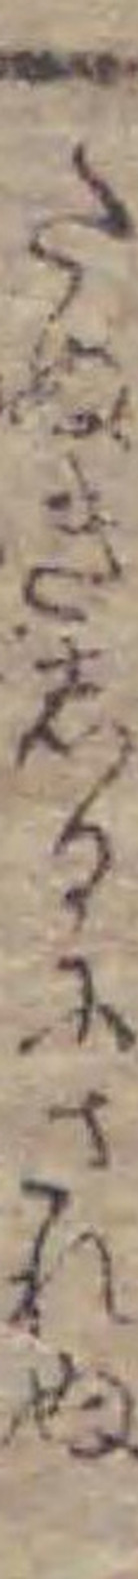たぬきしるにされぬ
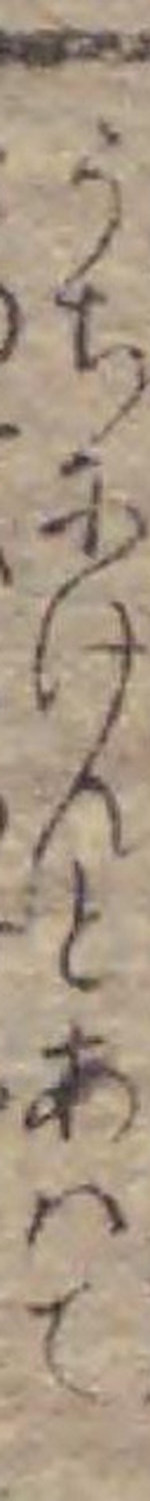うちにげんとあはて
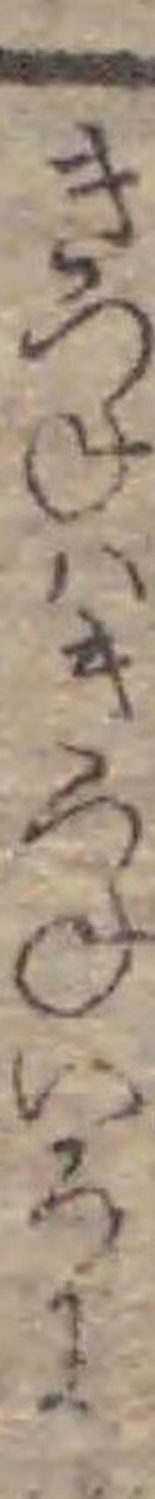きつねはきつねいろに
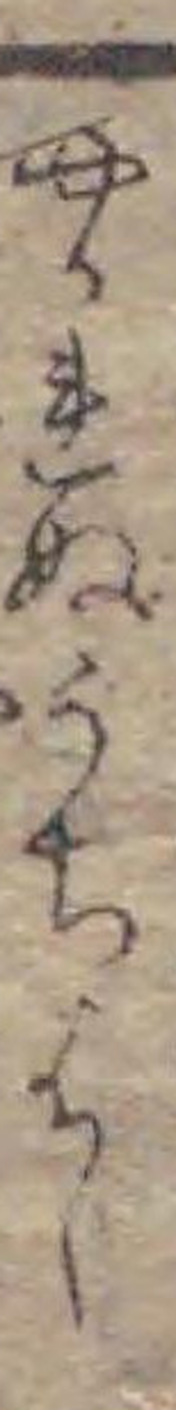やかれぬうちはし
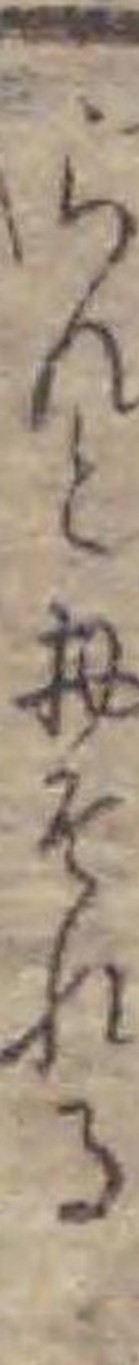らんとおそれる
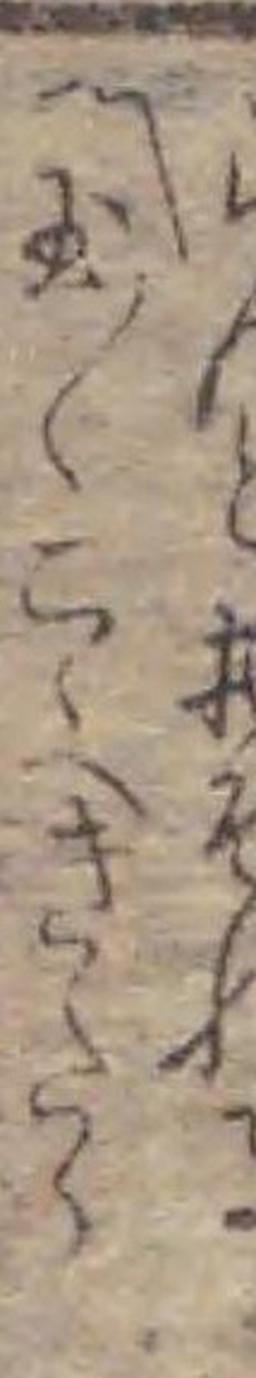〽玉〳〵こゝへきたら
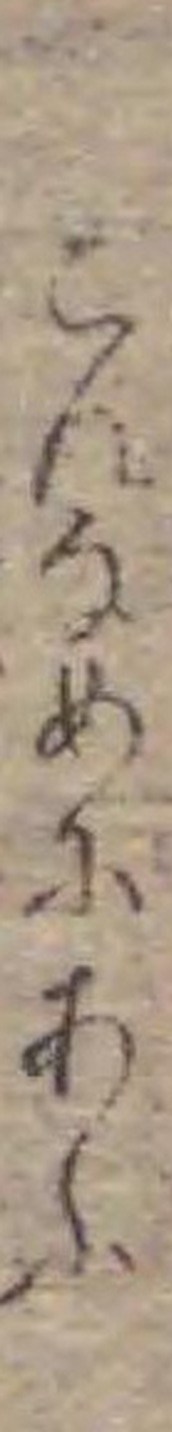こんなめにあふ
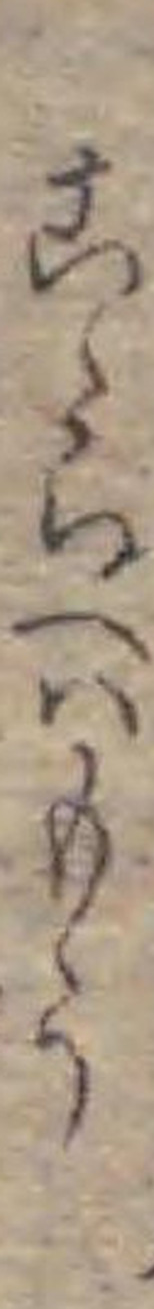こゝらへはもう
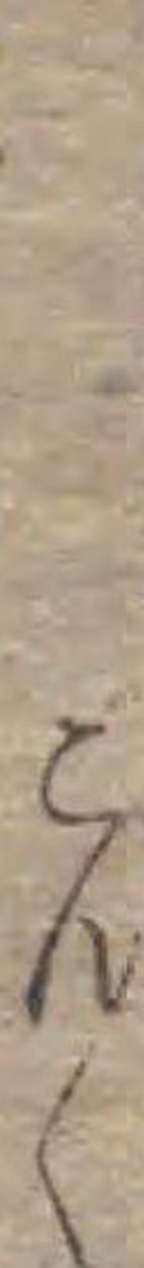こん〳〵
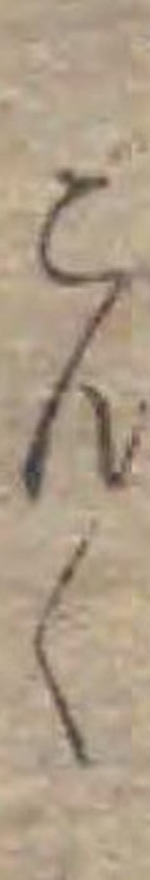こん〳〵
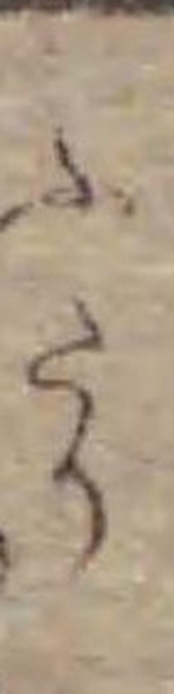ふたり
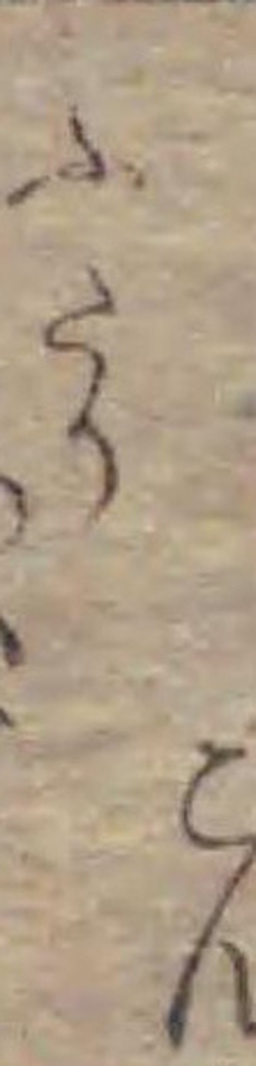ふたり
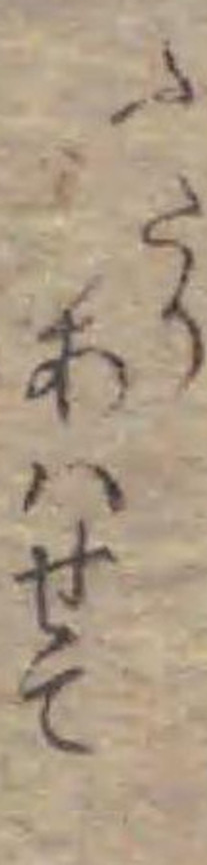あはせて
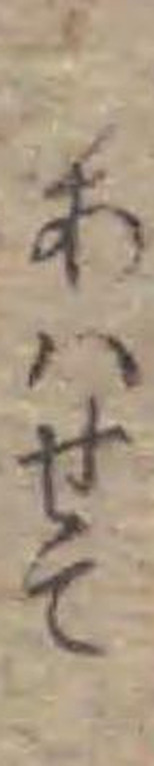あはせて
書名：怪物つれつれ草 : 2巻
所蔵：国立国会図書館 National Diet Library, JAPAN
